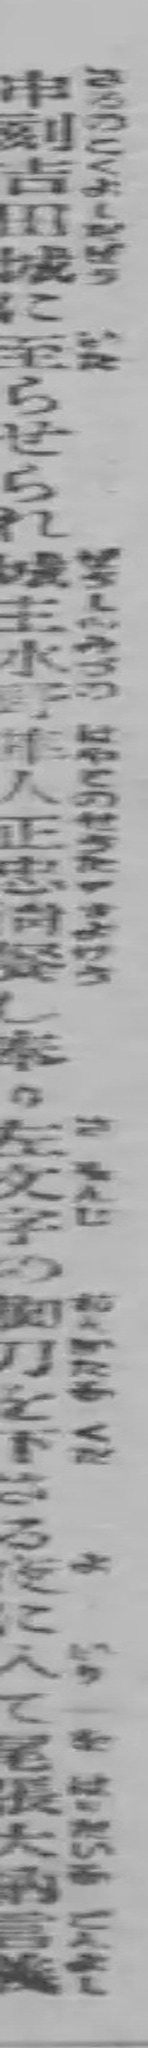申刻吉田城に至らせられ城主水野隼人正忠清饗し奉り左文字の御刀を下さる夜に入て尾張大納言義
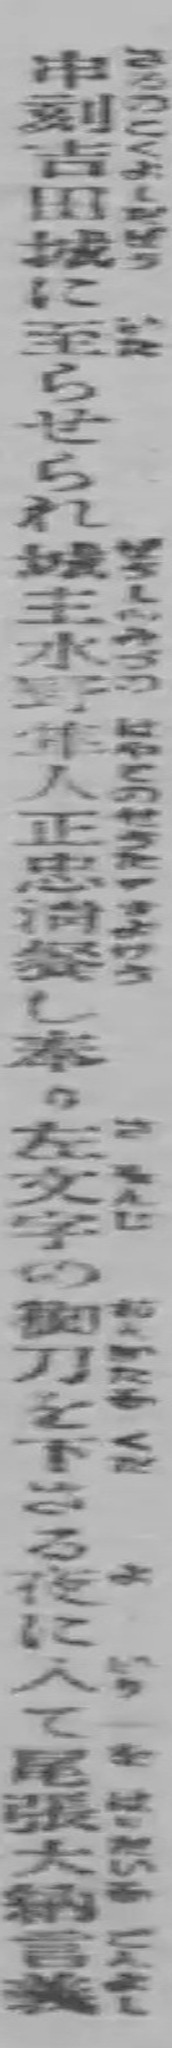申刻吉田城に至らせられ城主水野隼人正忠清饗し奉り左文字の御刀を下さる夜に入て尾張大納言義
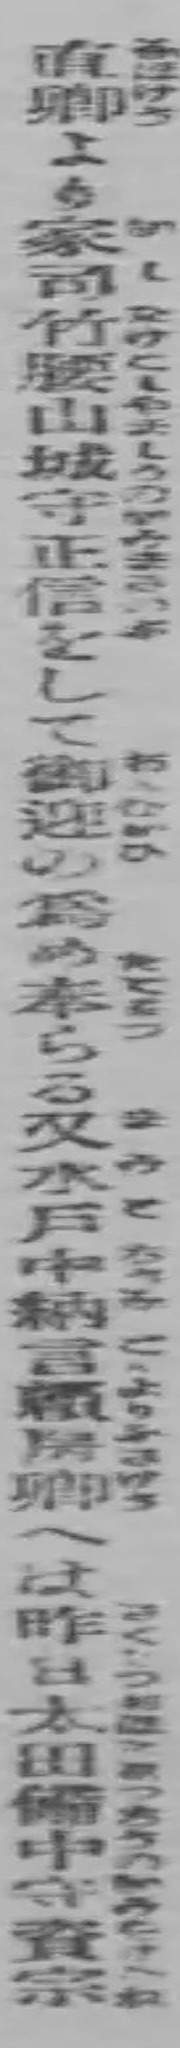直卿より家司竹越山城守正信をして御迎の為め奉らる又水戸中納言頼房卿へは昨日太田備中守資宗
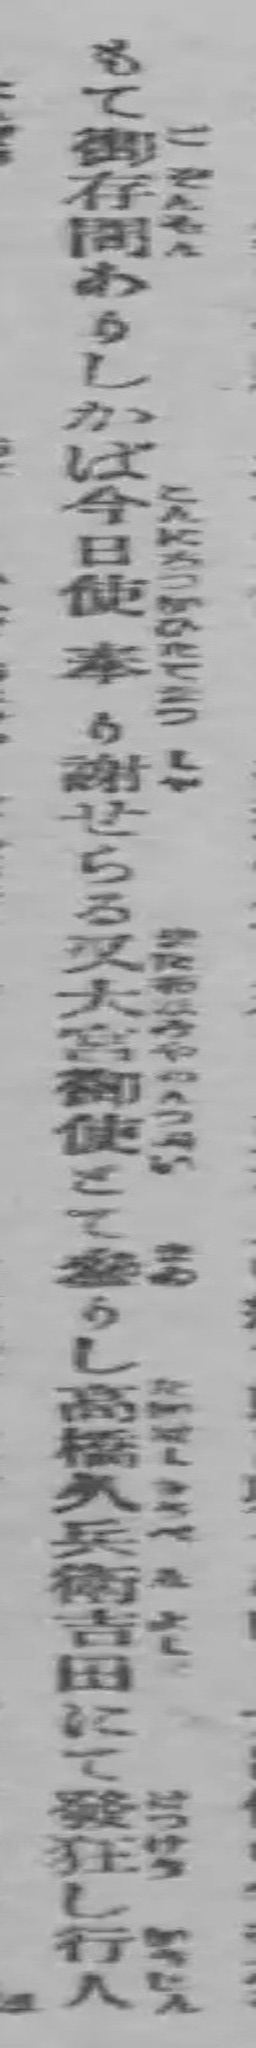もて御存問ありしかば今日使奉り謝せらる又大宮御使とて参りし高橋九兵衛吉田にて発狂し行人
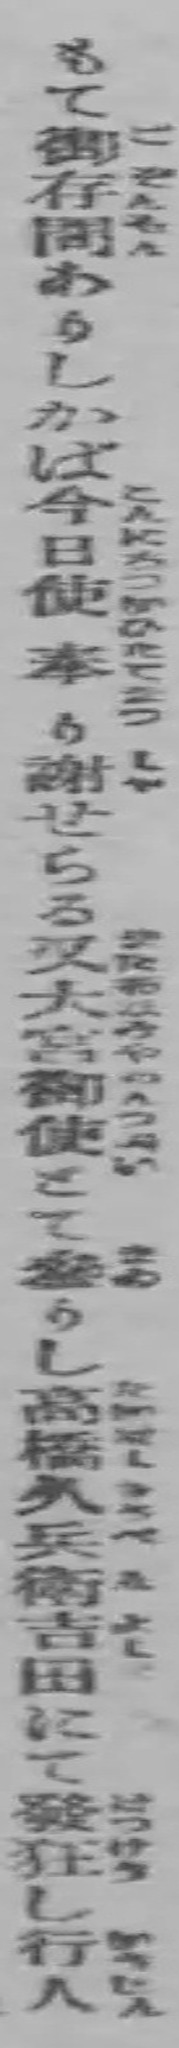もて御存問ありしかば今日使奉り謝せらる又大宮御使とて参りし高橋九兵衛吉田にて発狂し行人
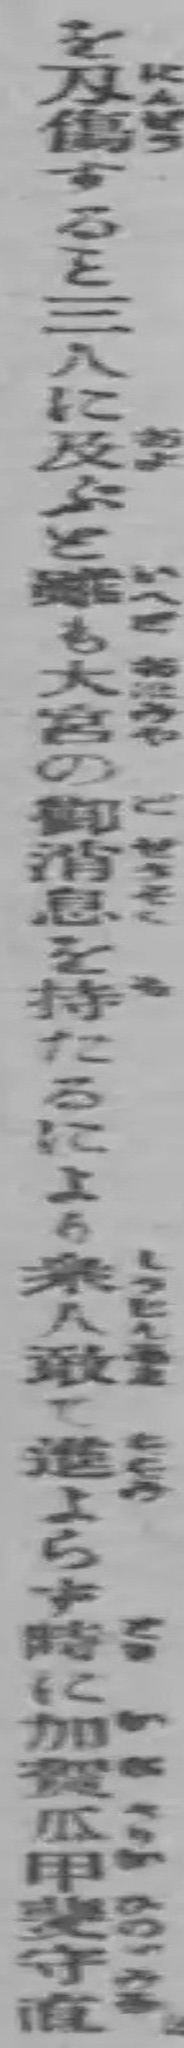を刃傷すること三人に及ぶと雖も大宮の御消息を持たるにより衆人敢て進よらず時に加賀瓜甲斐守直

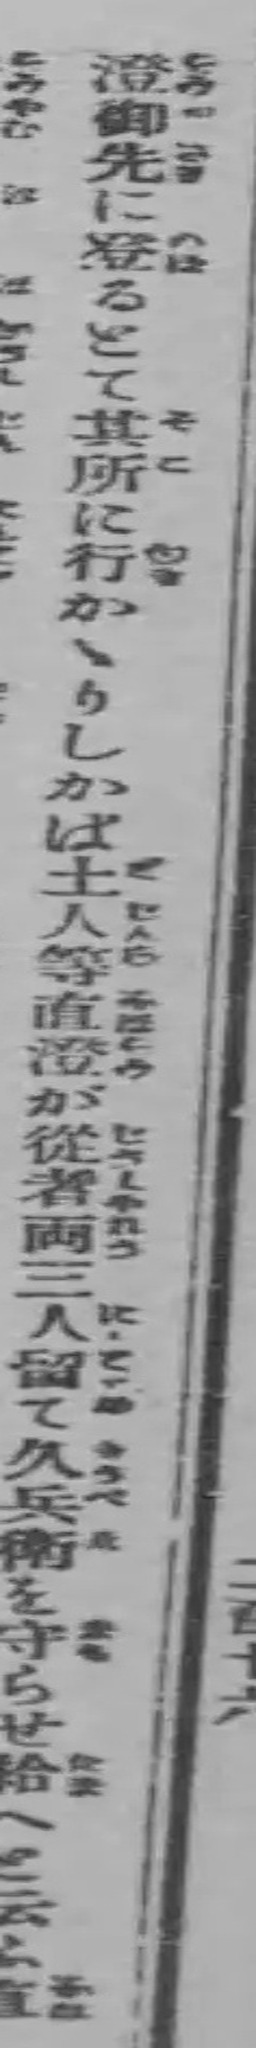澄御先に登るとて其所行かゝりしかば土人等直澄が従者両三人留て久兵衛を守らせ給へと云ふ直
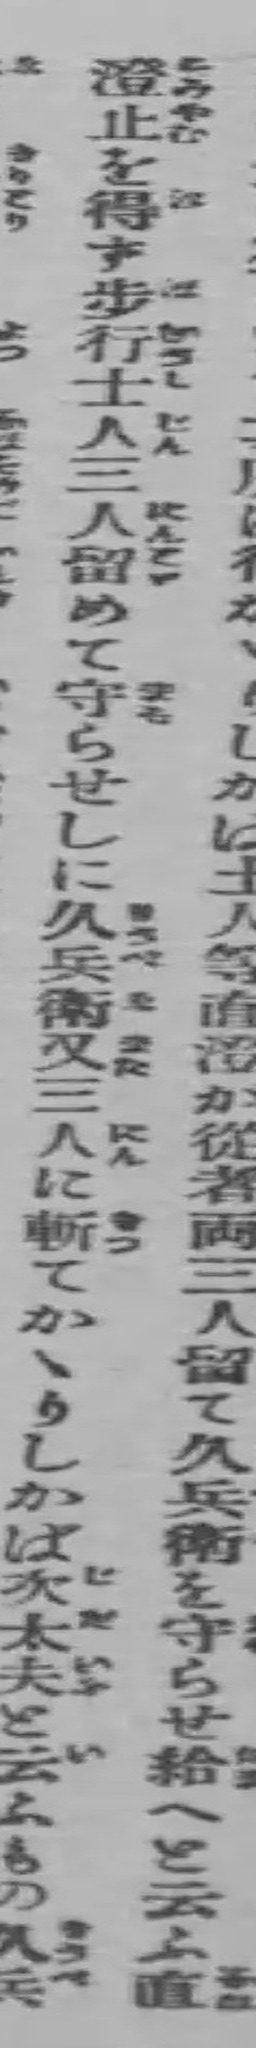澄止を得ず歩行士人三人留めて守らせしに久兵衛又三人斬てかゝりしかば次太夫と云ふもの久兵
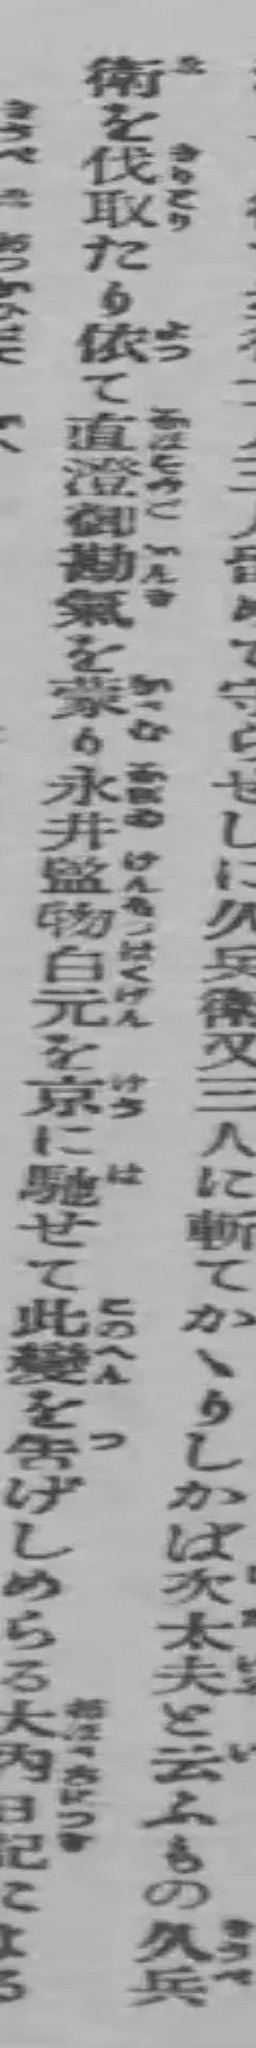衛を伐取たり依つて直澄御勘気を蒙り永井監物白元を京に馳せて此変を告げしめらる大内日記による
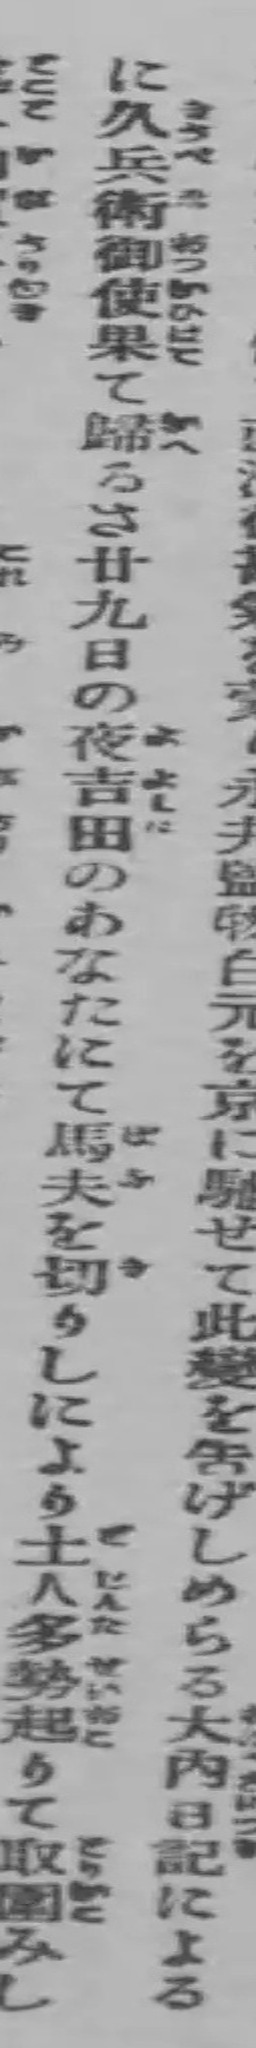に久兵衛御使果て帰るさ廿九日の夜吉田のあなたにて馬夫を切りしにより土人多勢起りて取囲みし
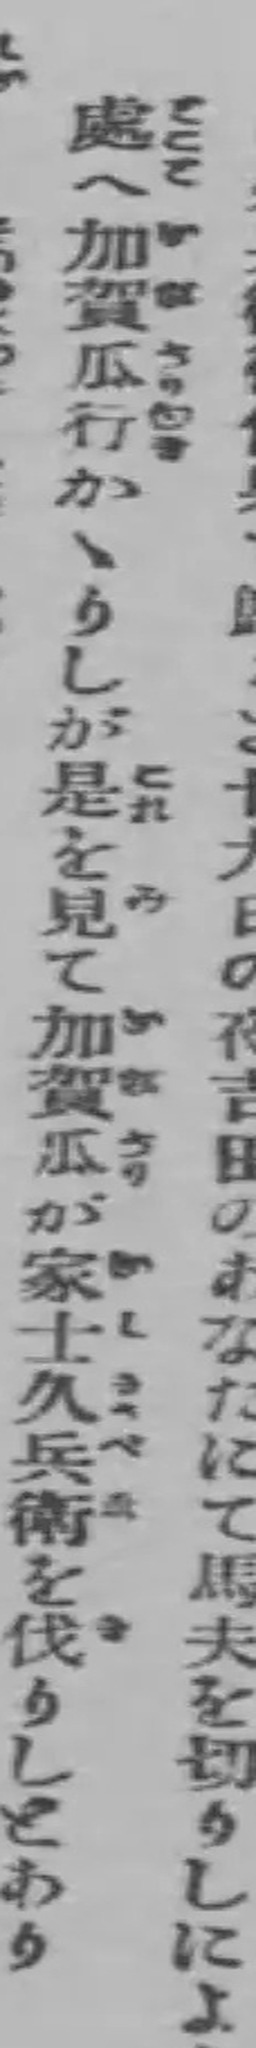処へ加賀瓜行かゝりしが是を見て加賀瓜が家士久兵衛を伐りしとあり
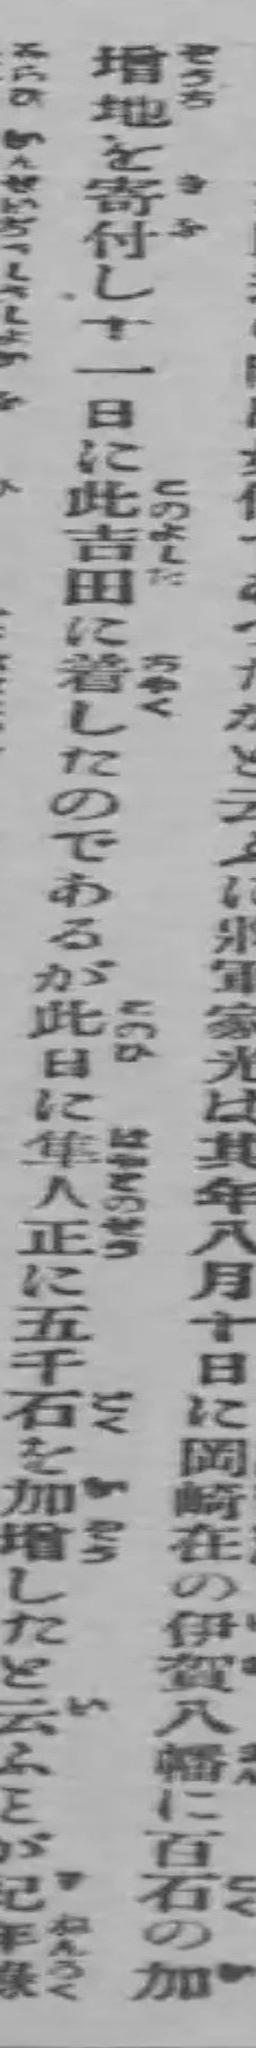増地を寄付し十一日に此吉田に着したのであるが此日に隼人正に五千石を加増したと云ふことが紀年録
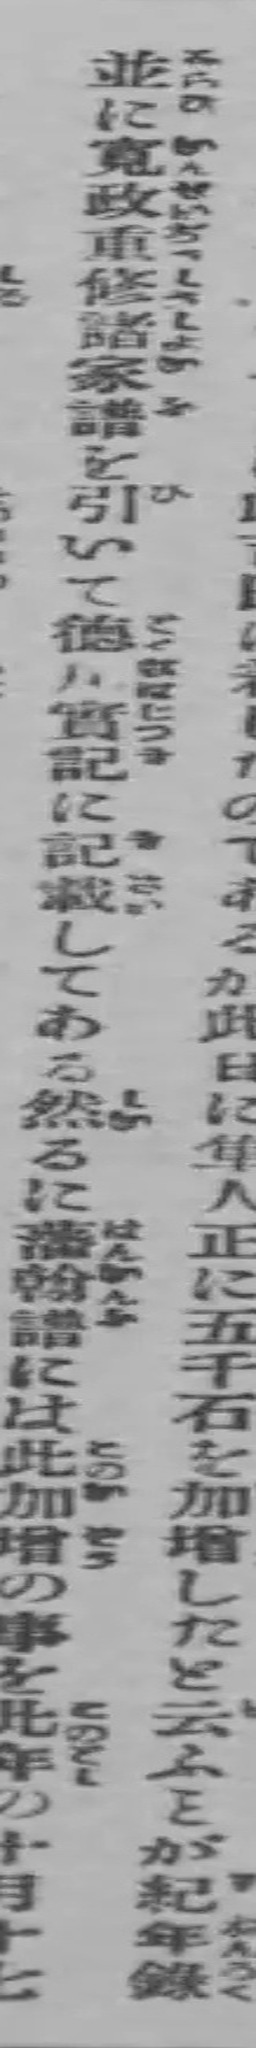並に寛政重修諸家譜を引いて徳川実記に記載してある然るに藩翰譜には此加増の事を此年の十月十七
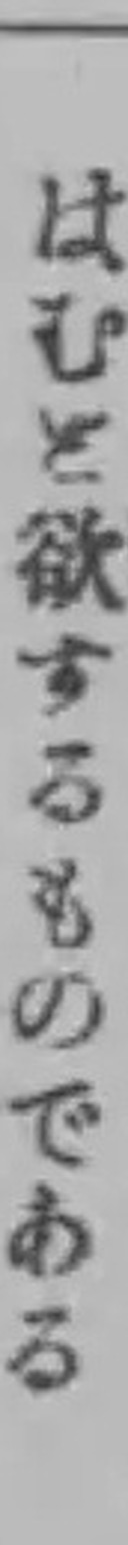はむと欲するものである
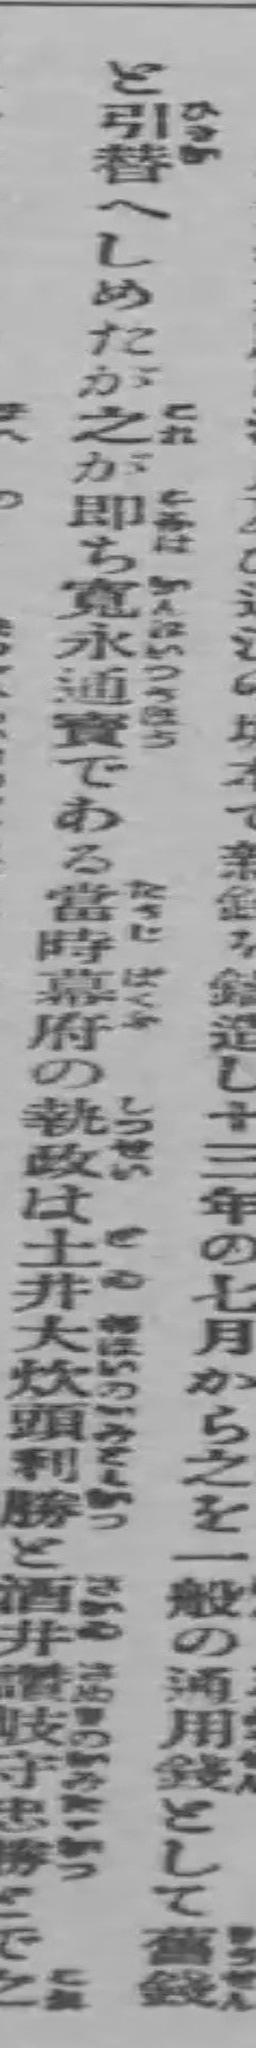と引替へしめたが之が即ち寛永通宝である当時幕府の執政は土井大炊頭利勝と酒井讃岐守忠勝とで之
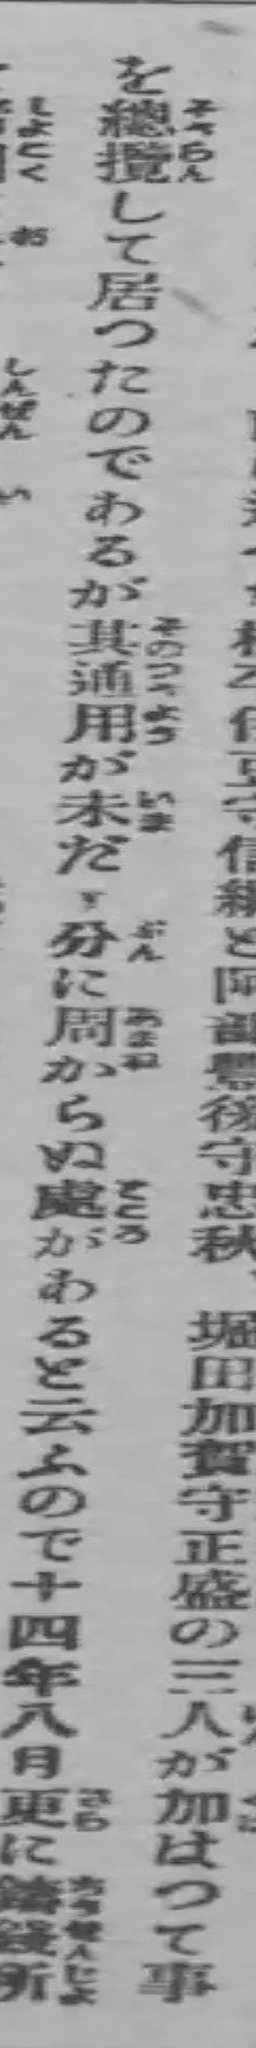を総攬して居つたのであるが其通用が未だに分に周からぬ処があると云ふので十四年八月更に鋳銭所
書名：豊橋市史談
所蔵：国立国会図書館 National Diet Library, JAPAN
